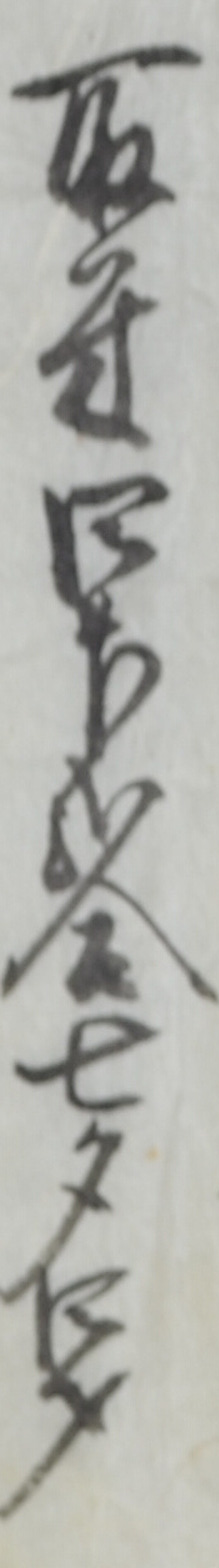取米四升弐合七勺四才

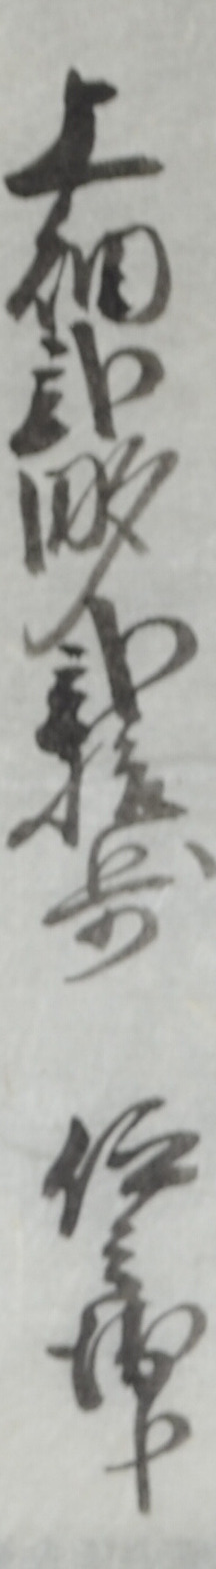上畑弐畝弐拾歩伊兵衛分
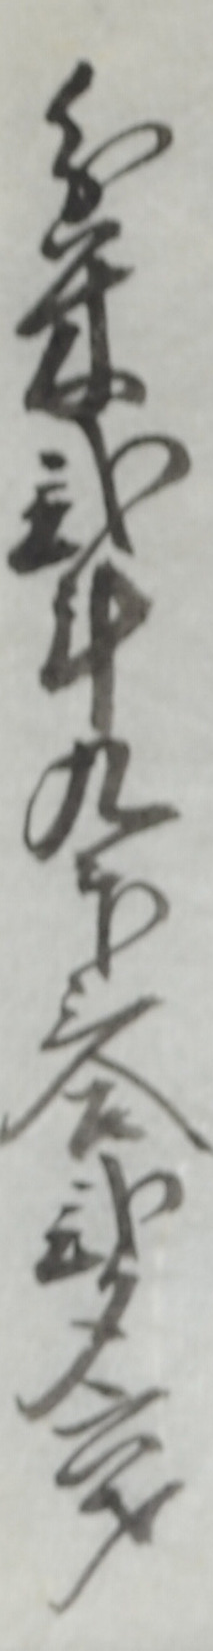分米弐斗九升三合弐勺六才
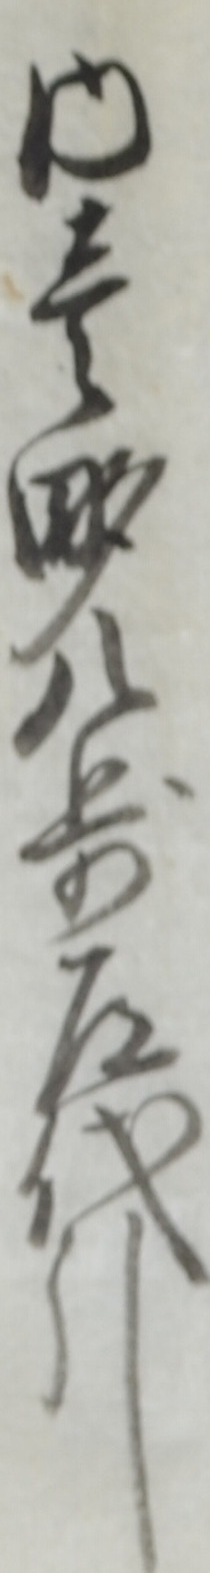内壱畝八歩屋代引
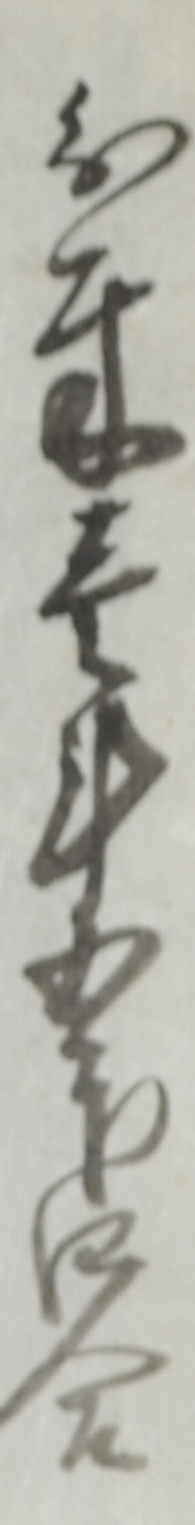分米壱斗五升四合
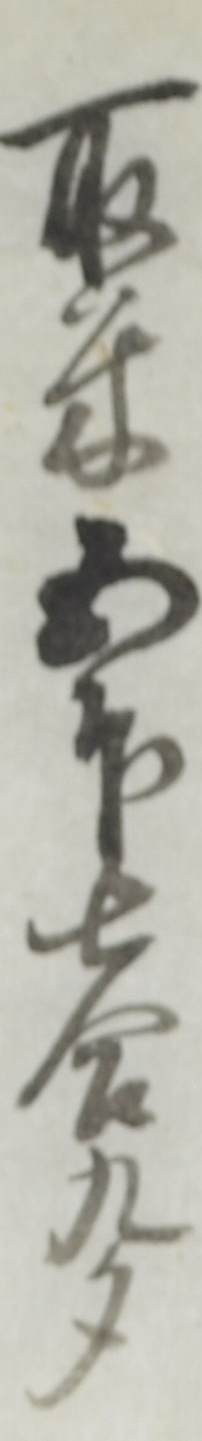取米五升七合九勺
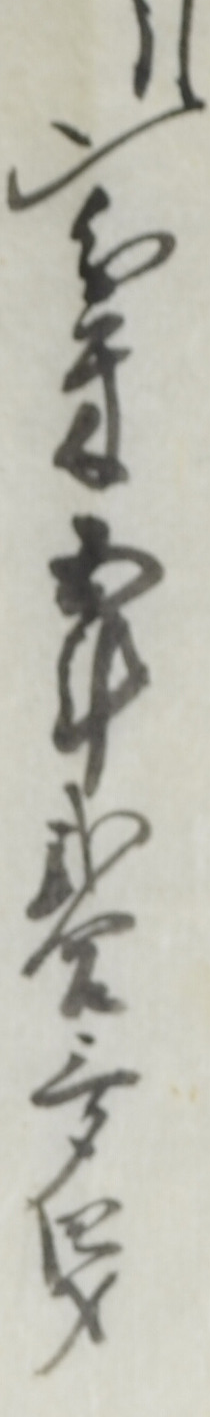引〆分米五斗弐合三勺四才
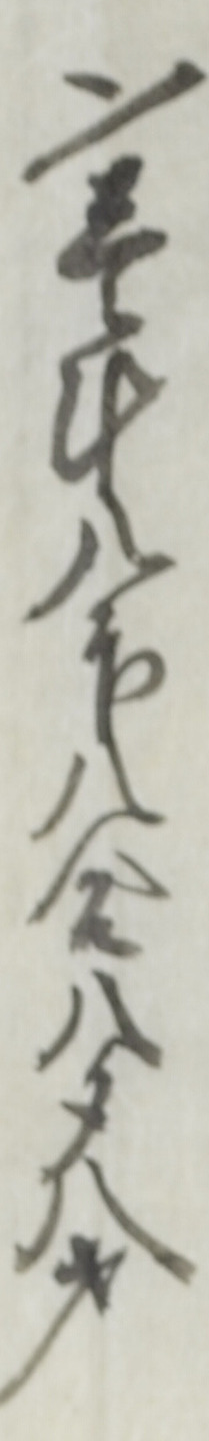〆壱斗八升八合八勺八才
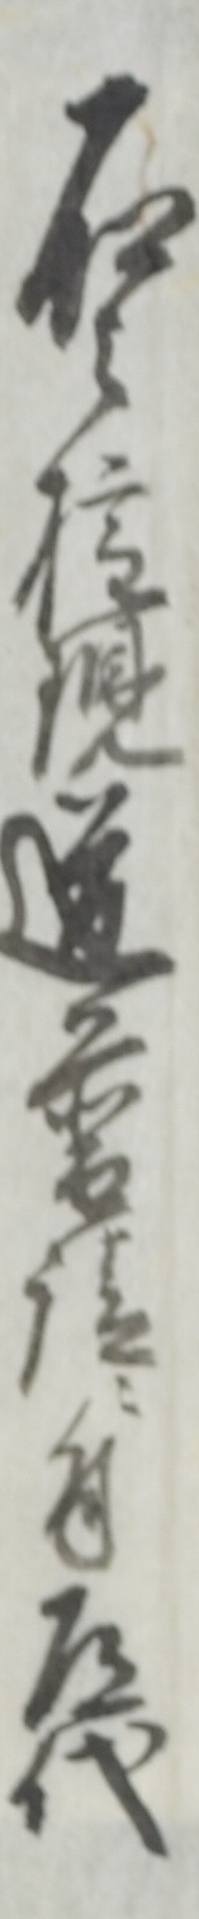右之権現道普請ニ付道代
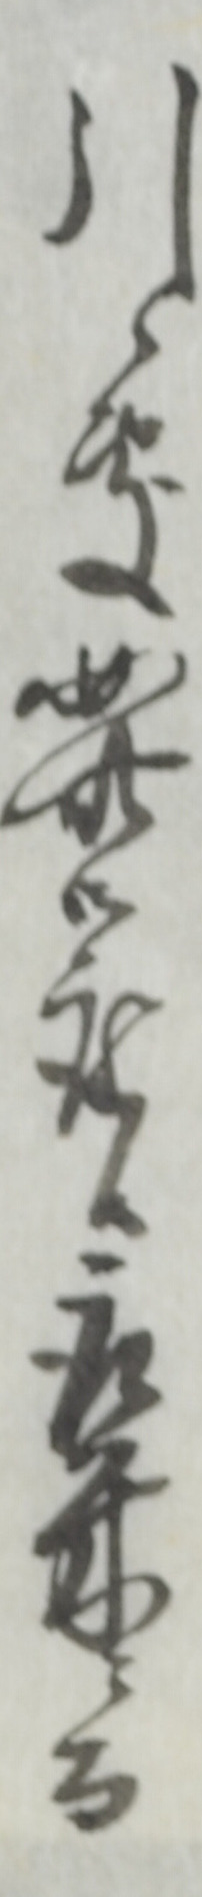引候処如此御座候取米ニ而
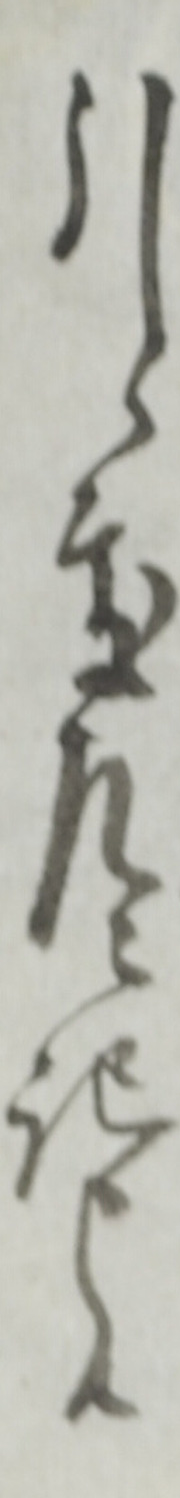引候処左ニ記申候
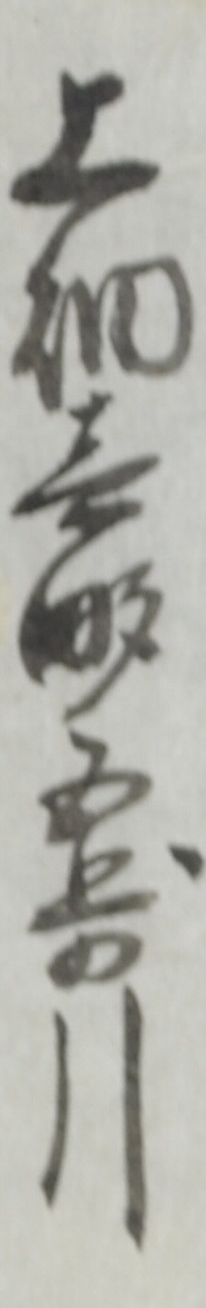上畑壱畝五歩引
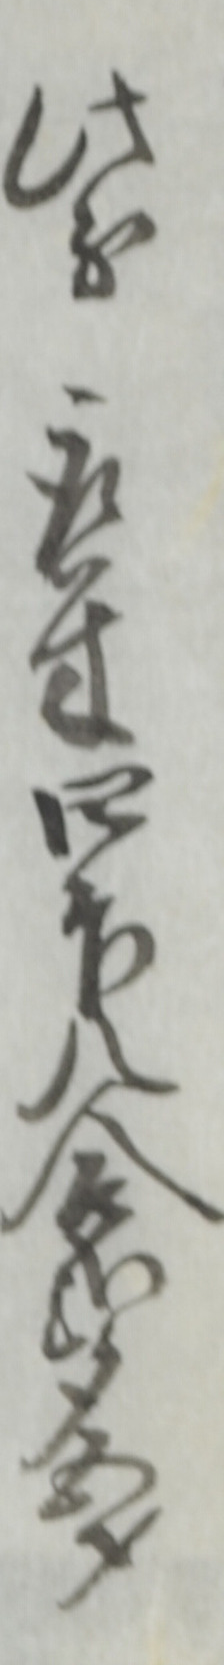此分取米四升八合弐勺五才
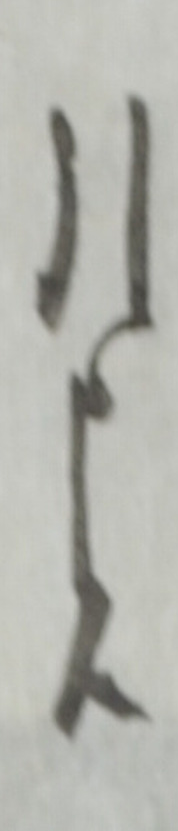引申候
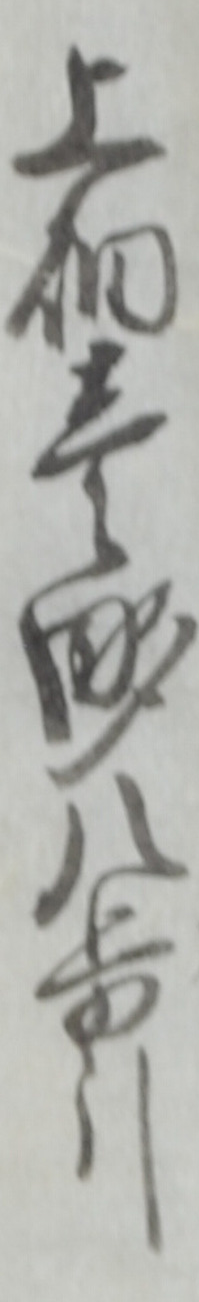上畑壱畝八歩引
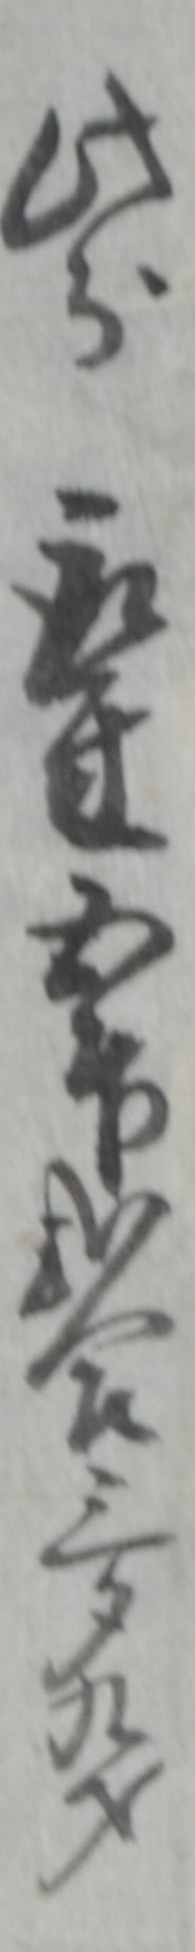此分取米五升弐合三勺
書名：鉾持村皆済権現道附替畝歩書付
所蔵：伊那市立高遠町図書館・合同会社AMANE
